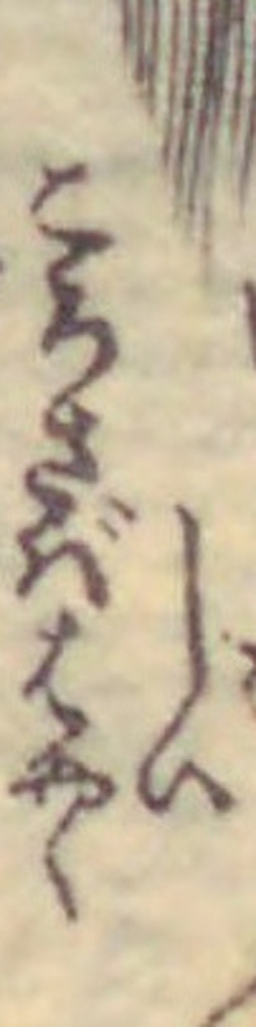ころさばはやく
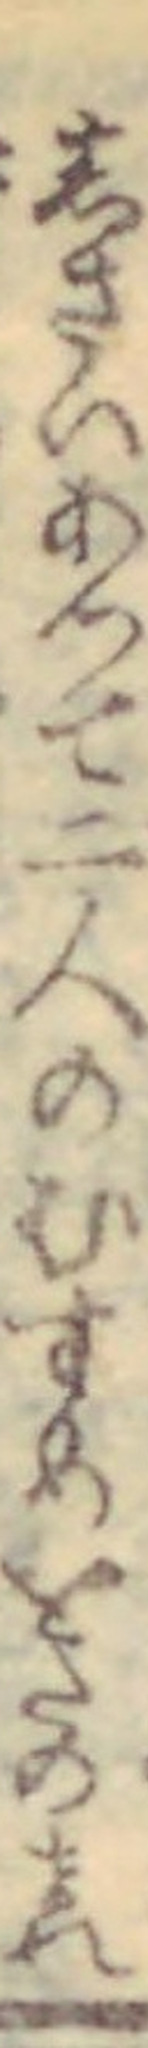したいあつて二人のむすめをたのまれ
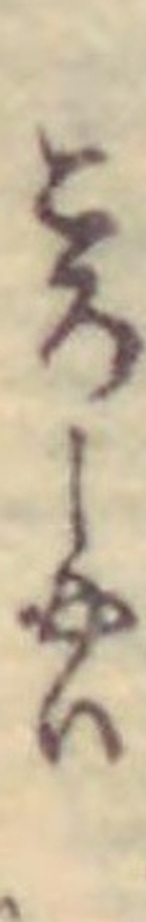ころしやい
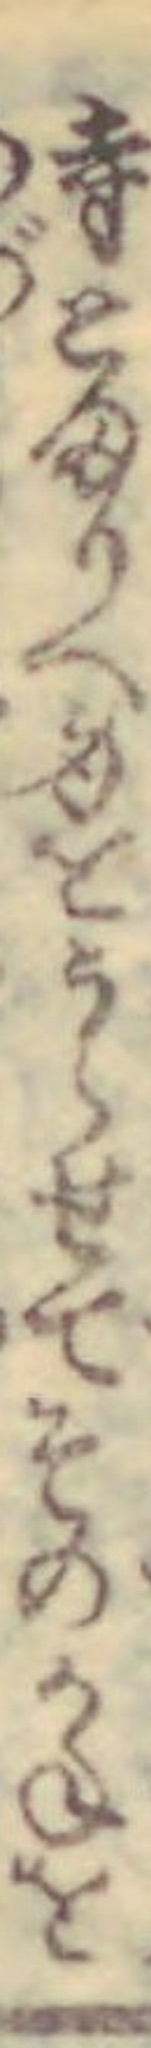寺とまりへ身をうらせてそのかねを
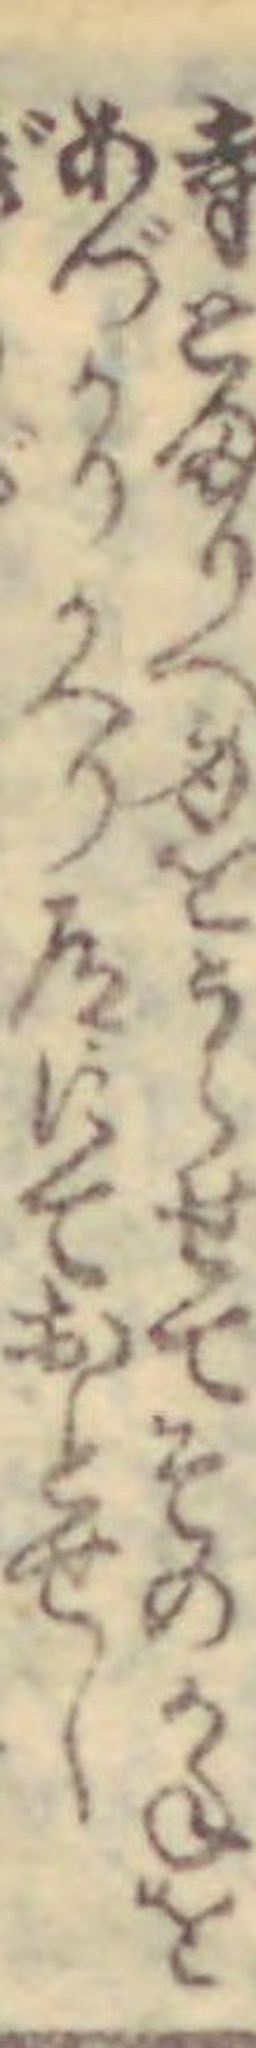あづかりかへり道にておとせし
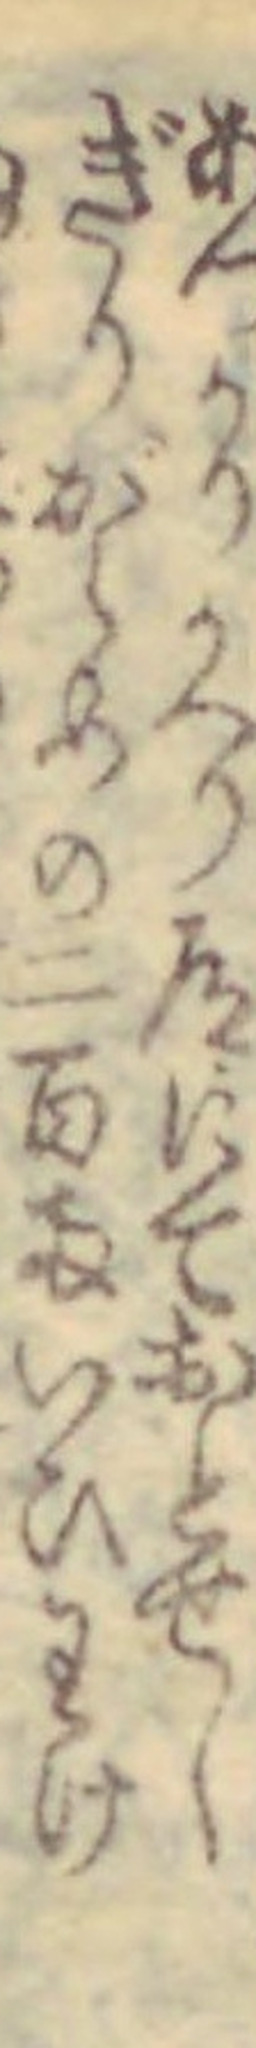ぎりからめの二百両いひわけ
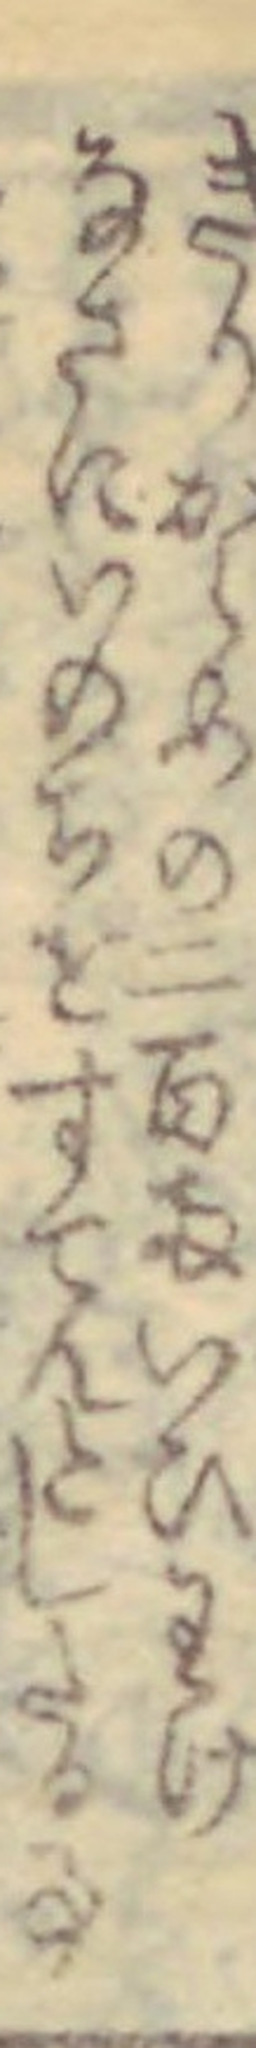なさにいのちをすてんとしたる事
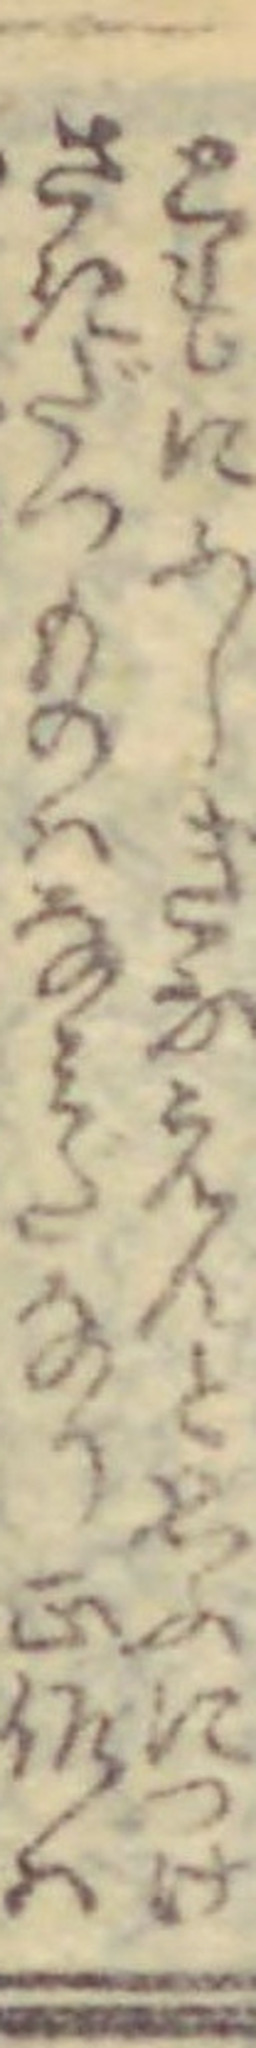さきだつものはなみだなり正作は
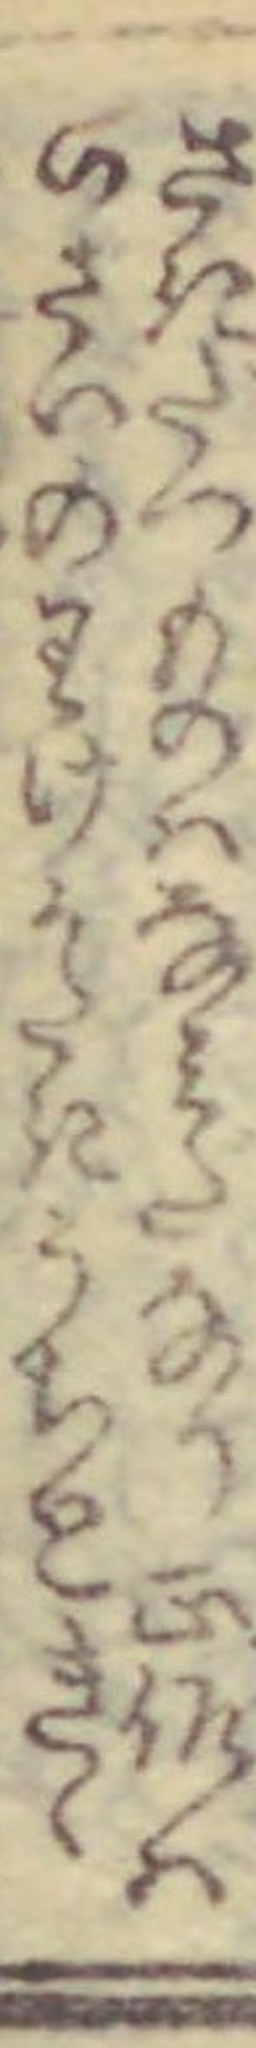いさいのわけかたきうちときゝ
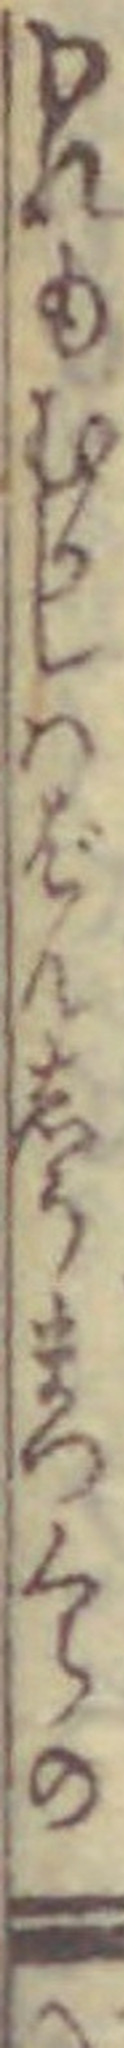われもむかしはばんしうまつくらの
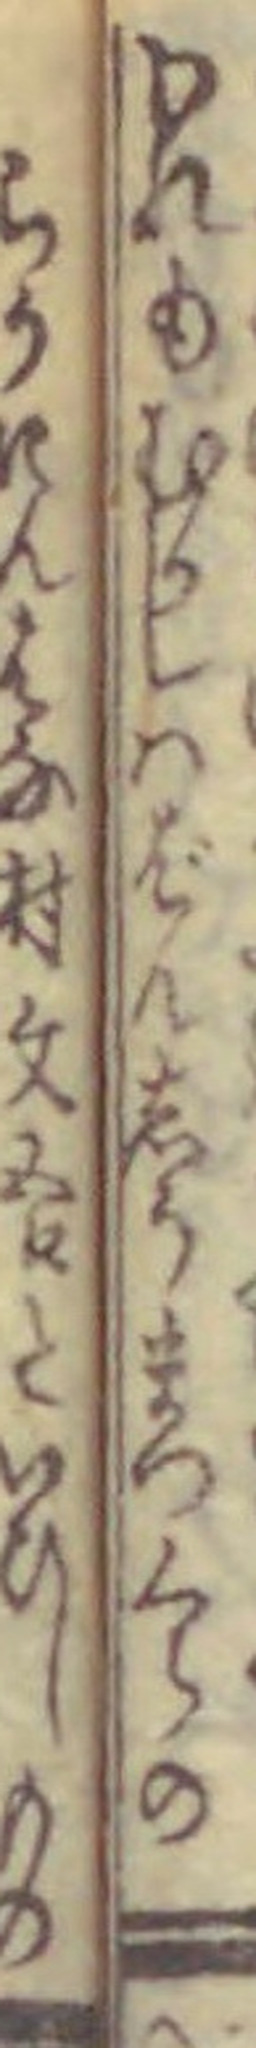らうにんはな村文吾といひしもの
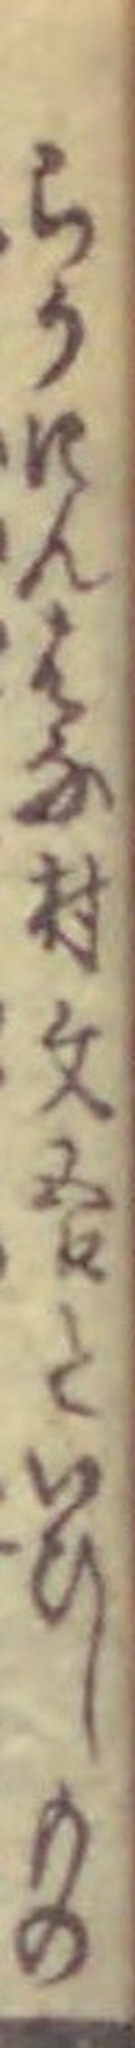らうにんはな村文吾といひしもの
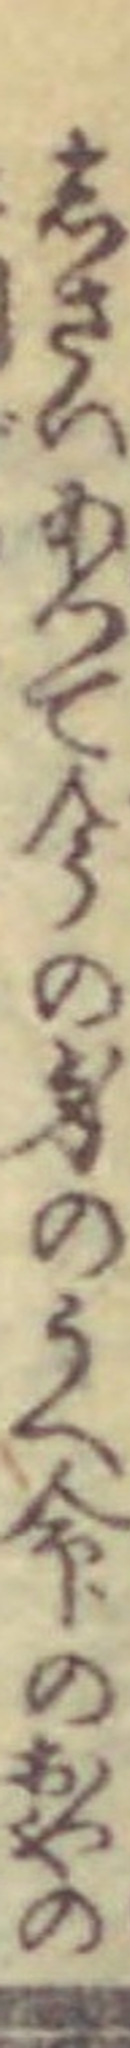しさいあつて今の身のうへ命のおやの
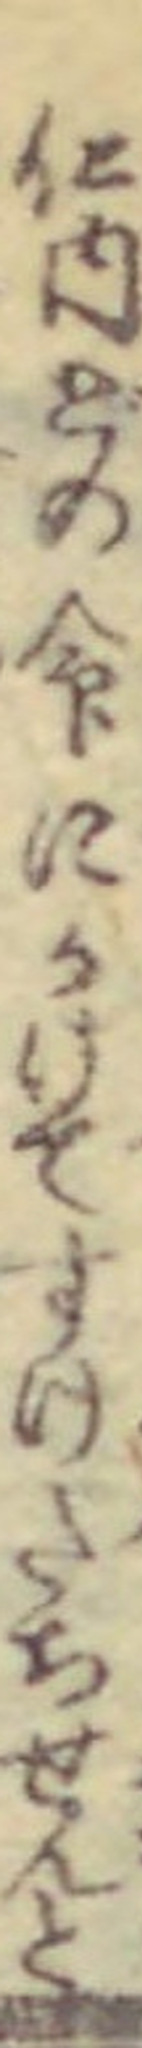仁内どの命にかけてすけたちせんと
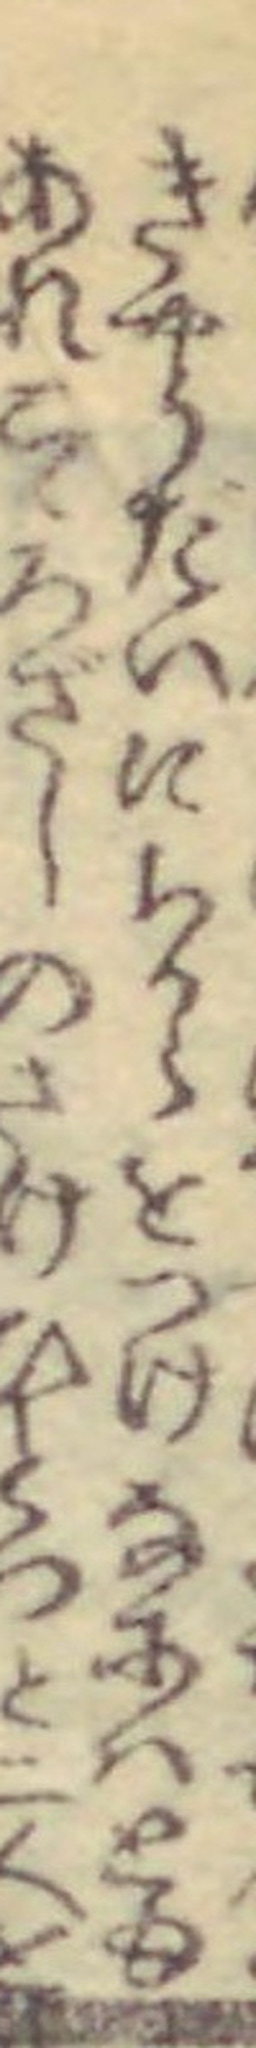あれこゝろざしのさけひとつと二人を
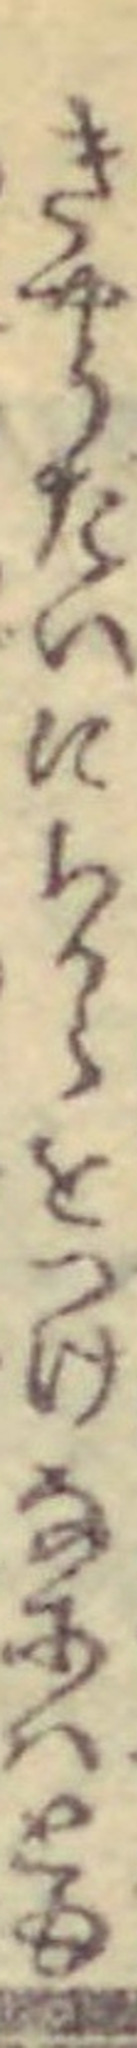きやうだいにちからをつけなにはとも
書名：八ツ目鱣因縁物語 3巻
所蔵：国立国会図書館 National Diet Library, JAPAN
